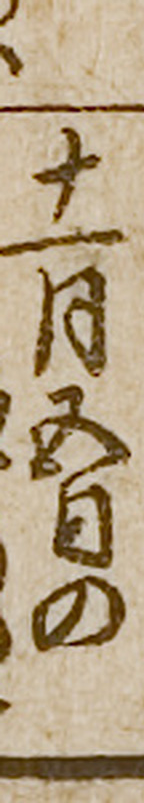十一月五日の
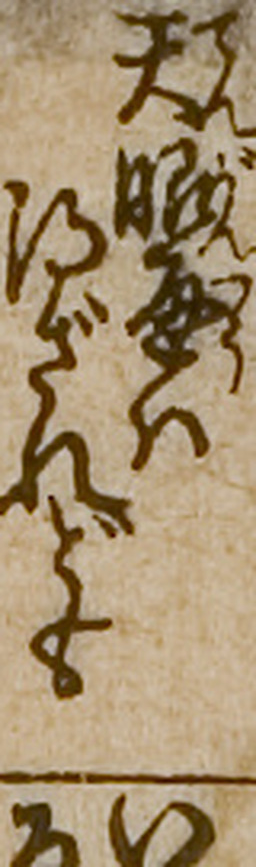得ざれども
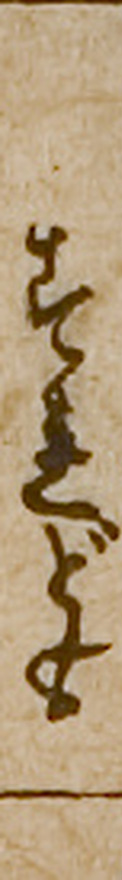すれども
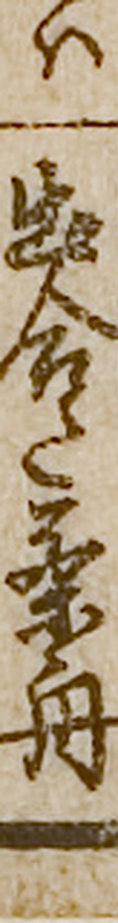出合た茶舟
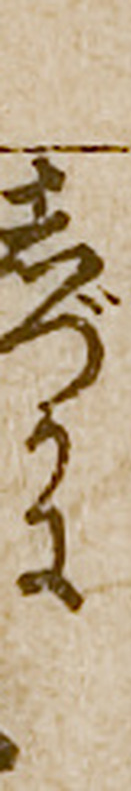しづかに
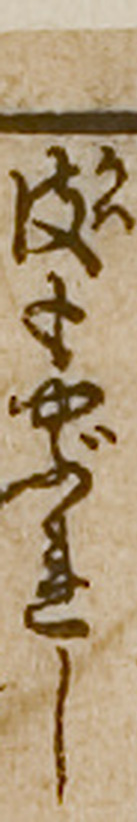皮もやぶれし
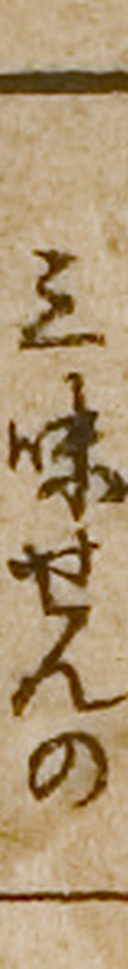三味せんの
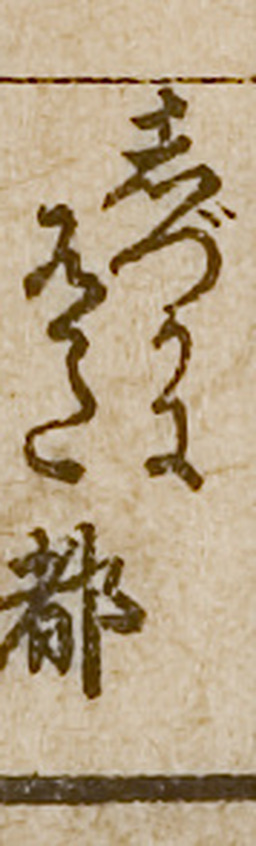有た都
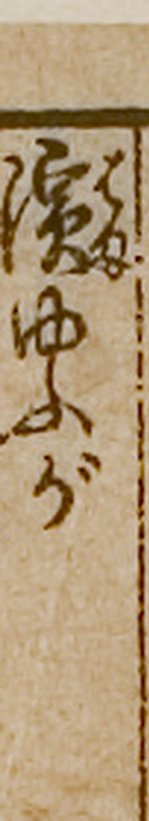濱ゆふが
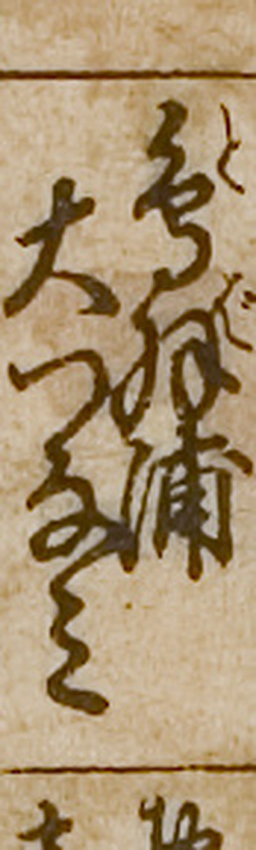大つなみ
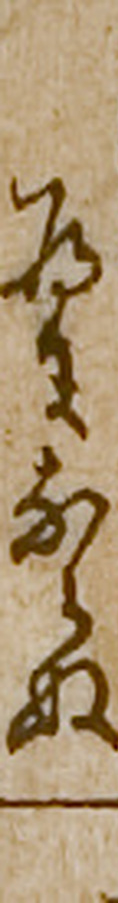為にならぬ
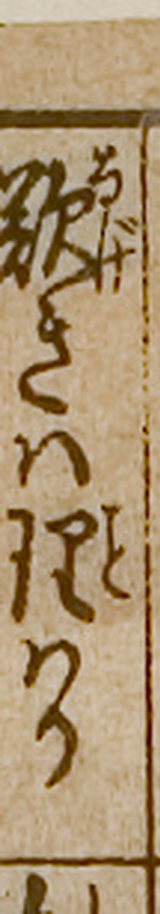嘆きは理はり
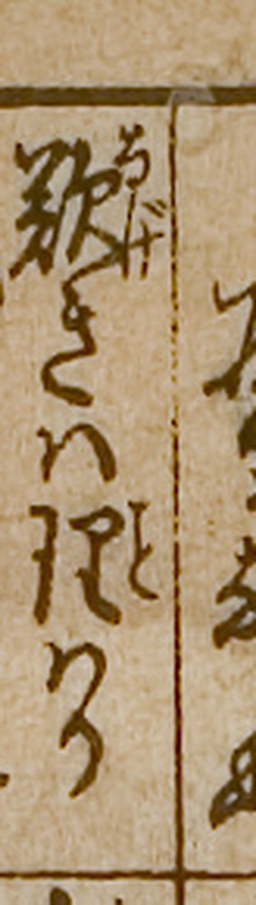嘆きは理はり
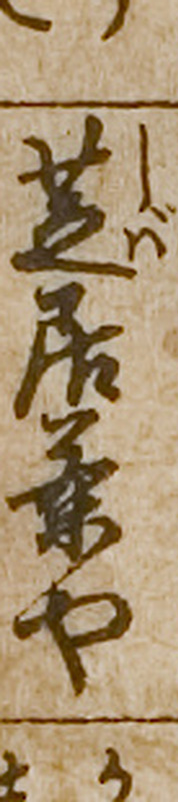芝居茶や
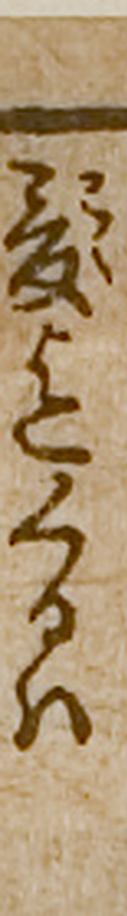爰迠くるは
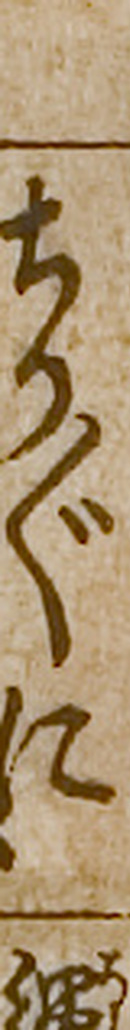ちり〴〵に
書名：大地震大津浪安達原三段目秡文句
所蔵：東京大学総合図書館 General Library in the University of Tokyo, JAPAN
